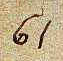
61
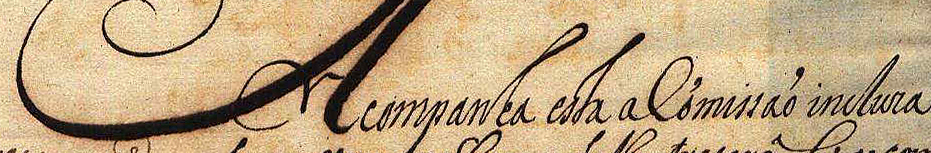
Acompanha esta a Cōmissaõ incluza
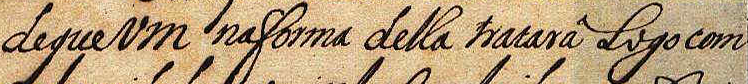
de que vm na forma della tratará Logo com
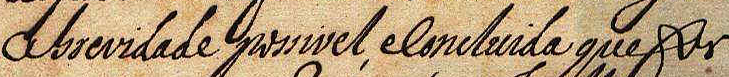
a brevidade possivel, e Concluida, que for
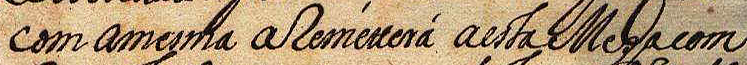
com a mesma a Remetterá a esta Meza com
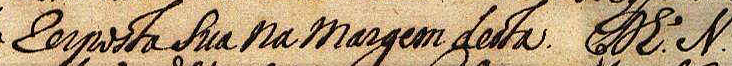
Resposta Sua na margem desta. Dh.o N.
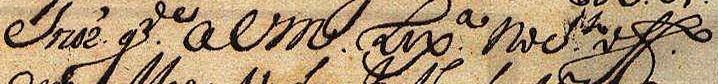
Snor̄. g.de a VM. Lix.a No S.to off.o
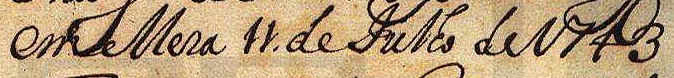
em Meza 11. de Iulho de 1743
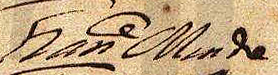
Franco Mendo
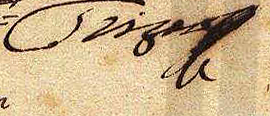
Trigoso
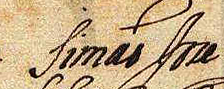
Simaõ Joze
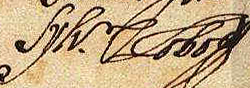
Sylv.r Lobo
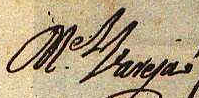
M.el Varejaõ
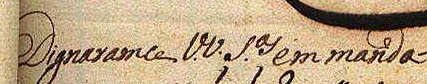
Dignaramce V.V. S.as em manda
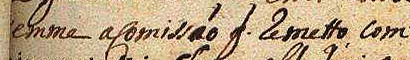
emme a Comissaõ q̄. Remetto, com
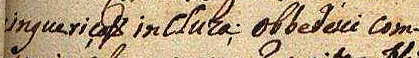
inqueriçaõ incluza; obbedesci com
